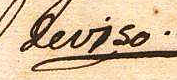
de i750.
